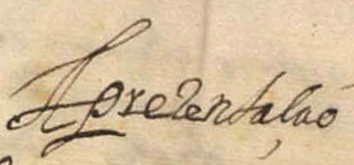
AprezentaÇaõ
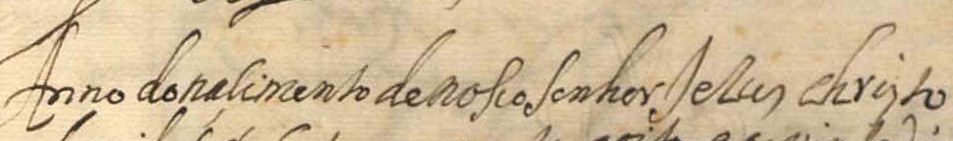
Anno do naCimento de nosso Senhor JeZus christo
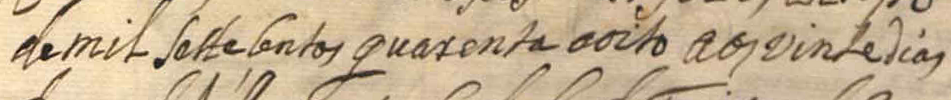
de miL setteCentos quarenta e oito aos vinte dias
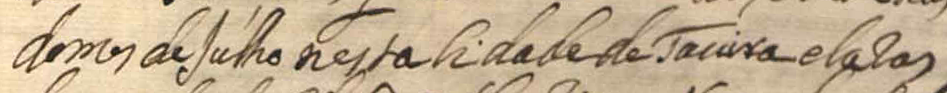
do mes de Julho nesta Cidade de Tauira e Cazas
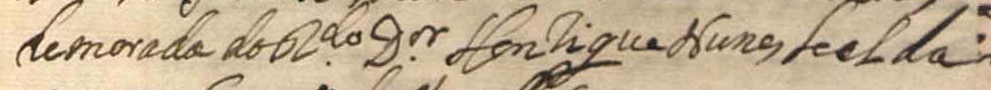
de morada do R.do D.or Henrique Nunes LeaL da
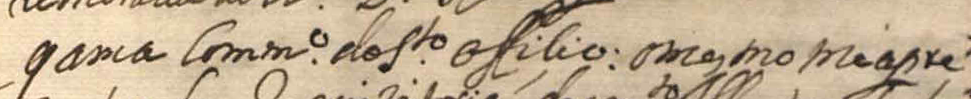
gama Comm.o do s.to officio: o mesmo me apre
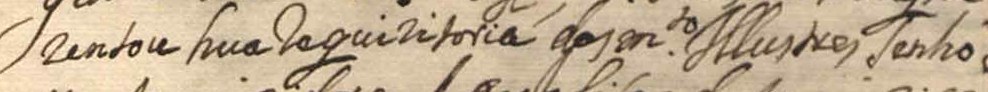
zentou hua Requizitoria dos m.to Illustres Senho
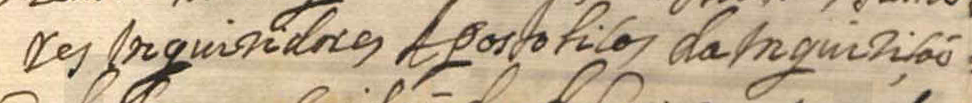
res Inquizidores ApostoliCos da InquiziÇaõ
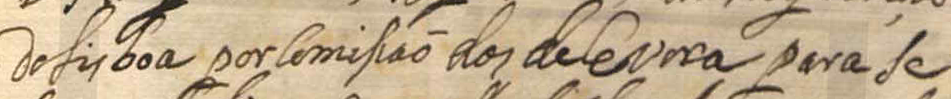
de Lisboa por Comissaõ dos de Evora para se
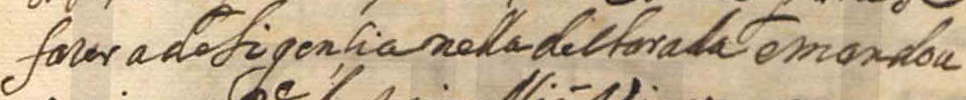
fazer a deligenCia nella declarada e mandou
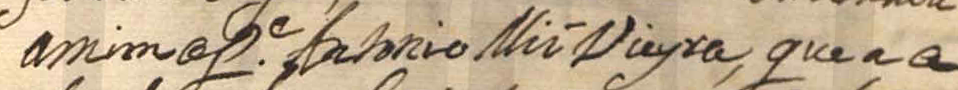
a mim o P.e Antonio Miz̄ Vieyra, que a a
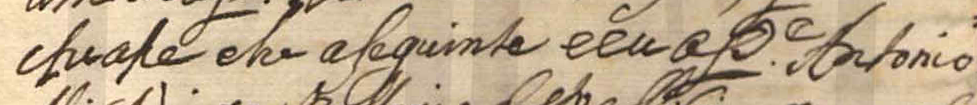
ctuasse e he a seguinte e eu o P.e Antonio
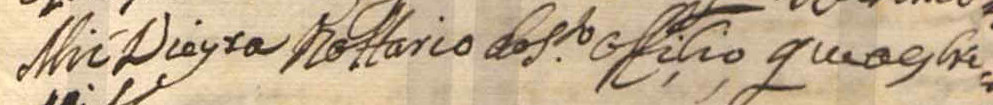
Miz̄ Vieyra nottario do s.to offiCio, que o esCre
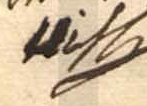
ui
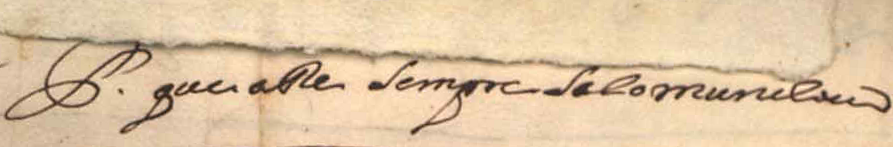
P. que a Re sempre se comuniCou
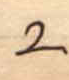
2
